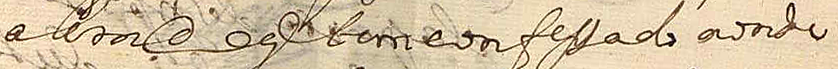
alem do q̄ tem confessado aonde
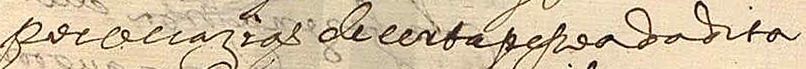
por occaziaõ de certa pessoa da dita
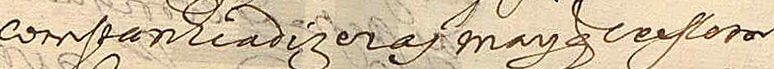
companhia dizer as mais q̄ cressem
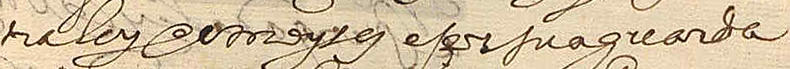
na ley de moyses e por sua guarda
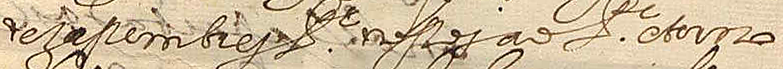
rezassem tes P.e nossos ao P.e eterno
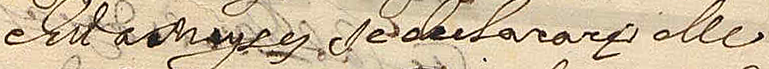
e hū a Moyses se declararaõ elle
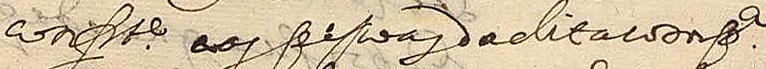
confit.e e as pessoas da dita comp.a
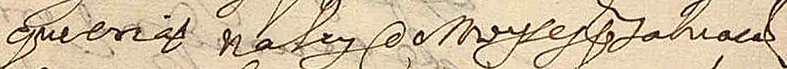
que criaõ na Ley de Moyses pa saluaçaõ
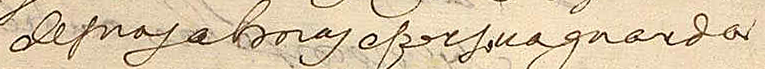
de suas almas e por sua guarda
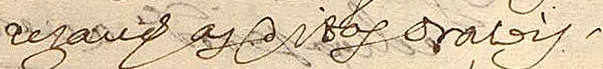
rezauaõ as ditas oraçois.
